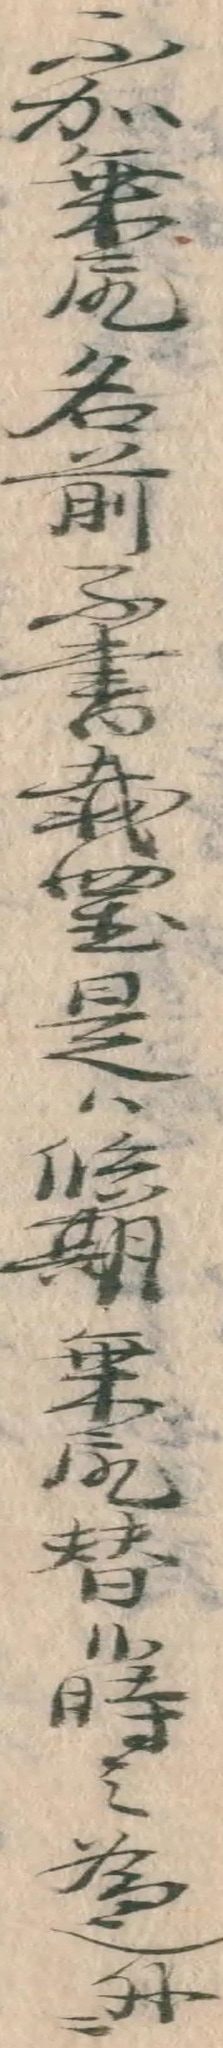不加乗尻名前不書載置是ハ臨朝乗尻替候時之為也外ニ
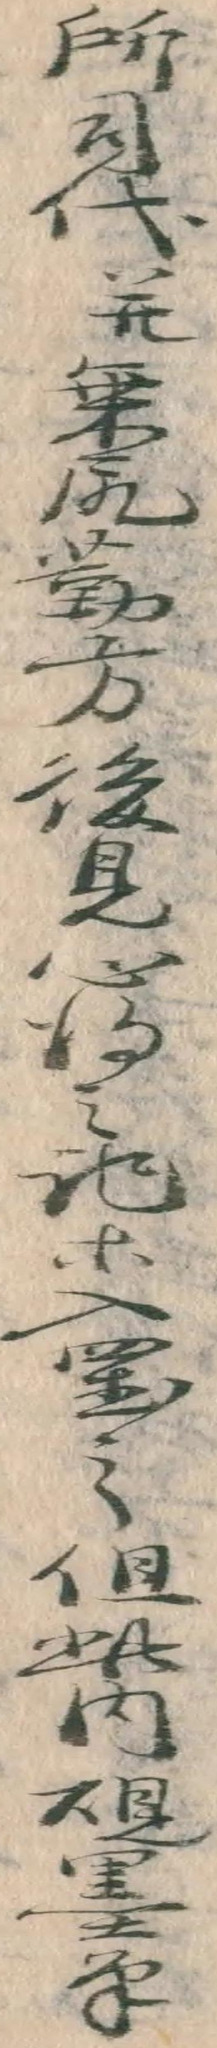所司代并乗尻勤方後見心得之記等入置之但此内硯墨筆
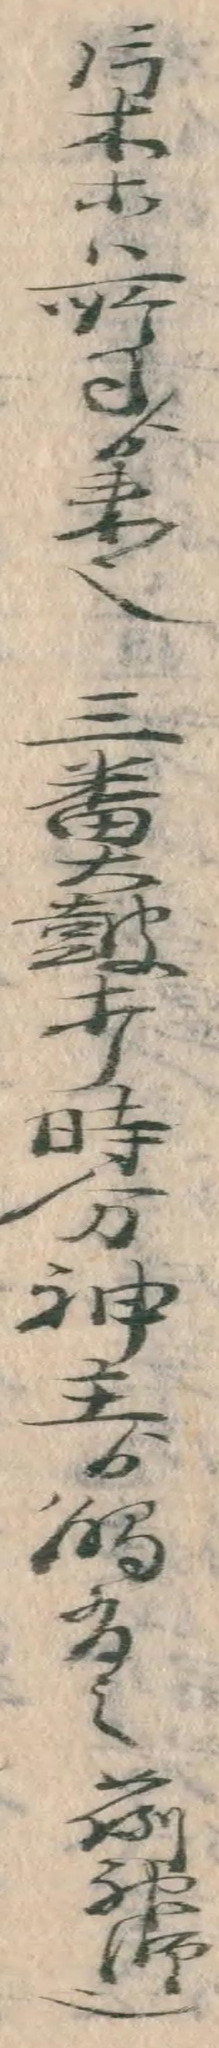片木等ハ所司ゟ来也三番大鼓打時分神主ゟ触有之如例神師也
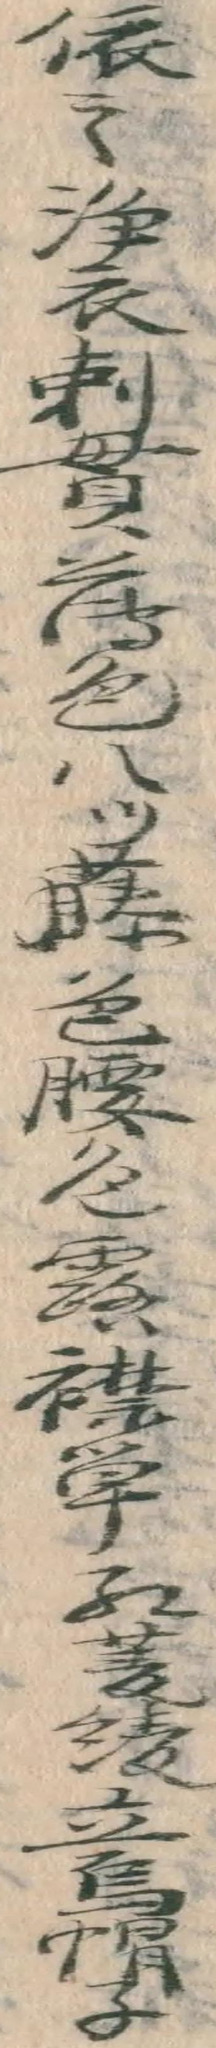依之浄衣刺貫薄色八ツ藤色腰色露襟単紅蓋綾立烏帽子
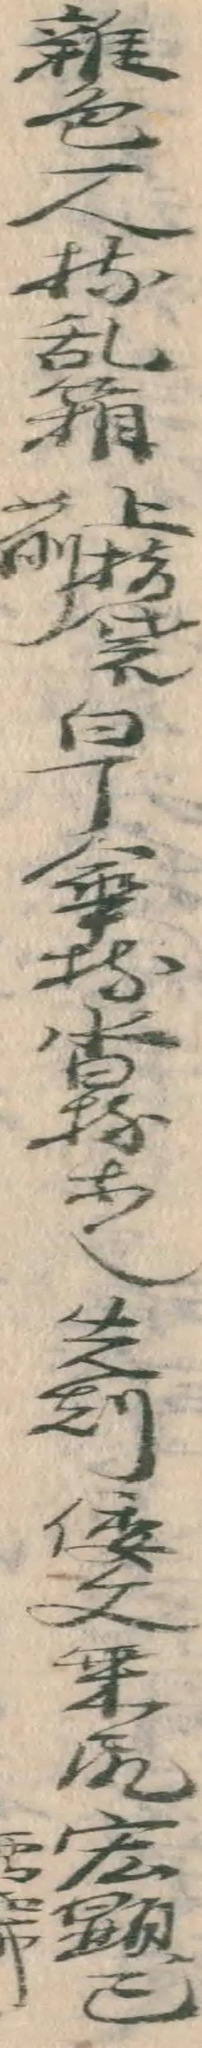雑色一人持乱箱上指袋如例白丁傘持沓持等之先刻倭文朱尻宏顕已
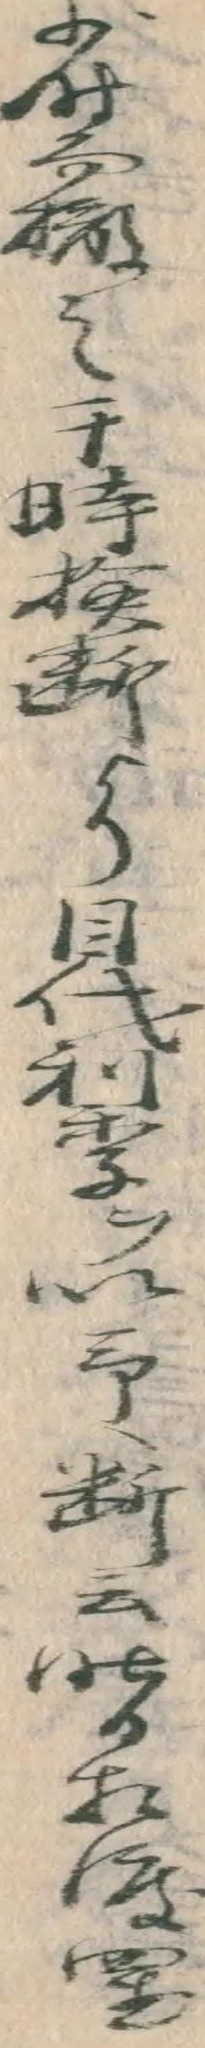少付而極之于時検断より目代利季ヲ以予へ断云昨日相渡置
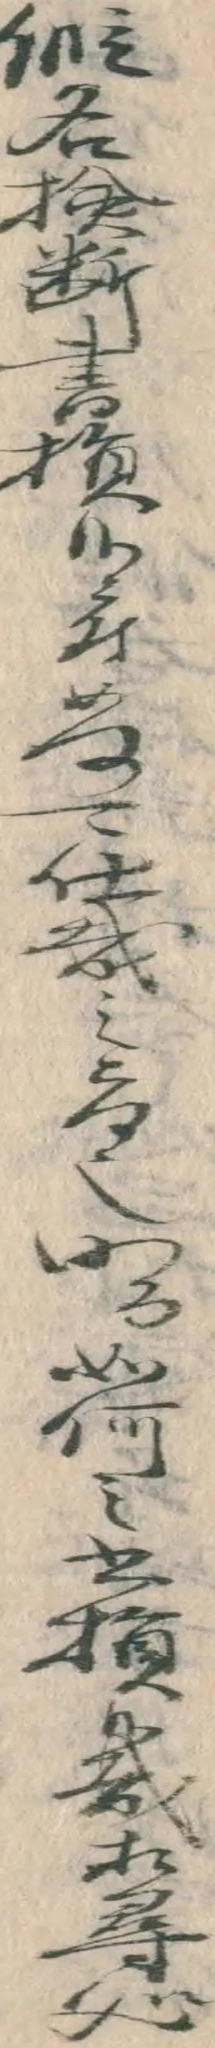仮名検断書損候ニ付如何可仕哉之旨也仍而如何之書損ニ候哉相尋処
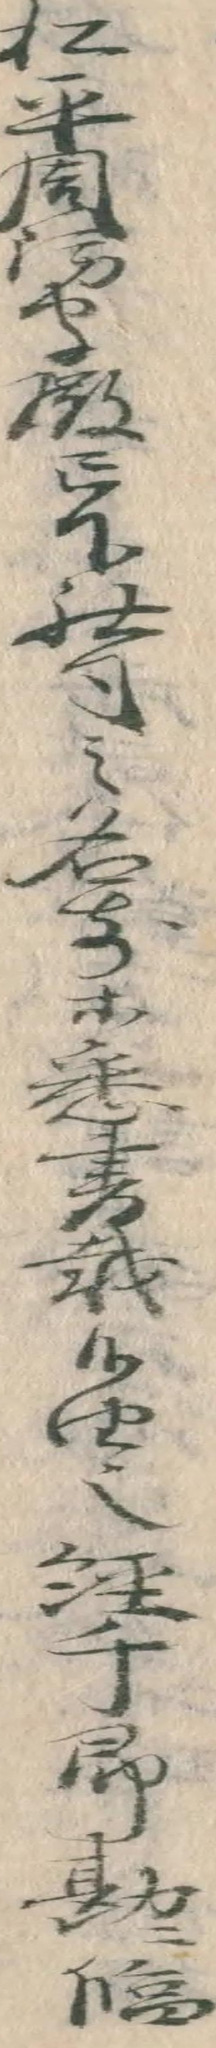松平周防守殿已下社司之名前等悉書載候由也経千即勘ニ條
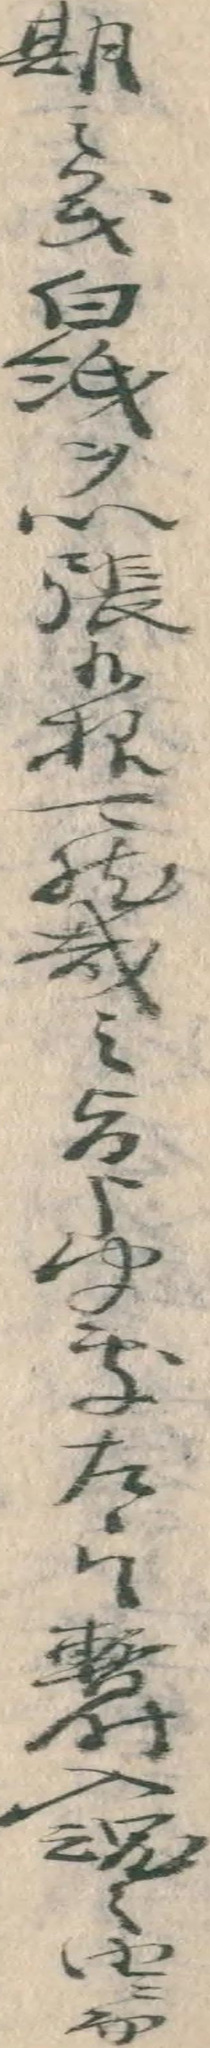期之義白紙ヲ以張候様可然哉之旨申聞候處左候ハヽ暫時入魂之由ニ而
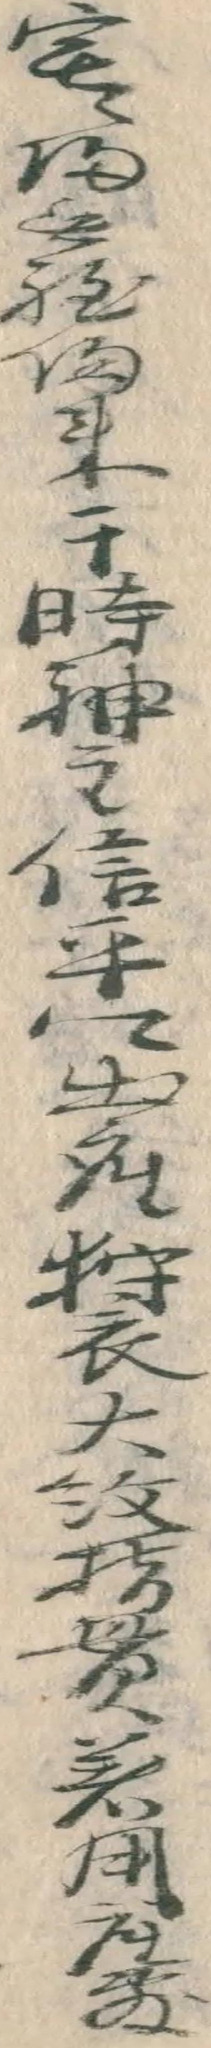宅へ帰無難帰来于時神主信平卿出座狩衣大紋指貫着用座敷
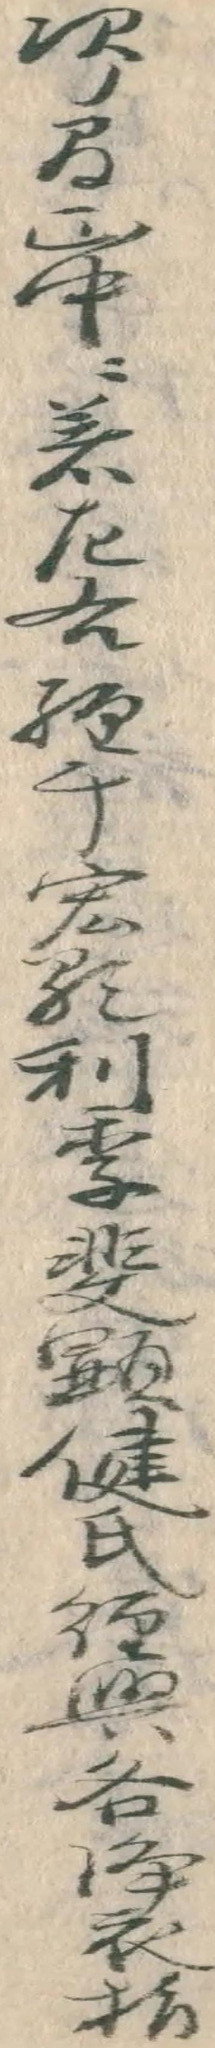次ノ間正中ニ着左右経千宏顕利季斐顕健氏経興各浄衣指
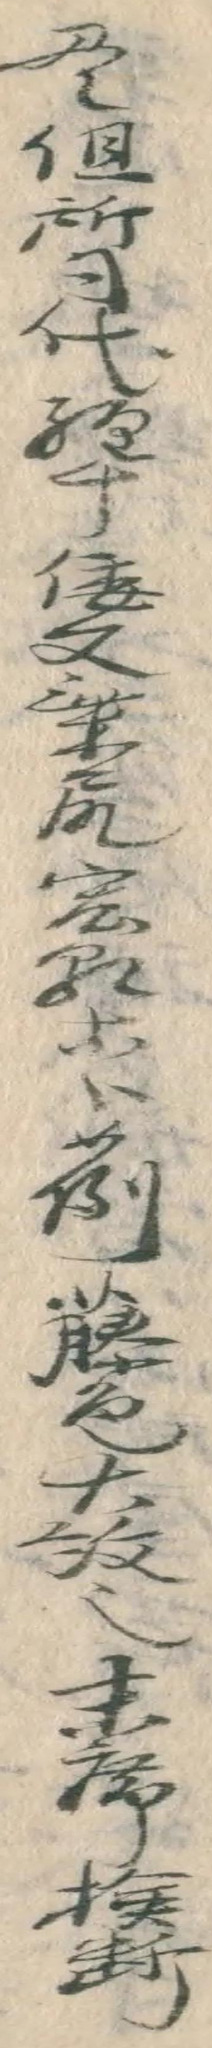貫但所司代経千倭文乗尻宏顕等ハ如例藤色大紋也末席検断
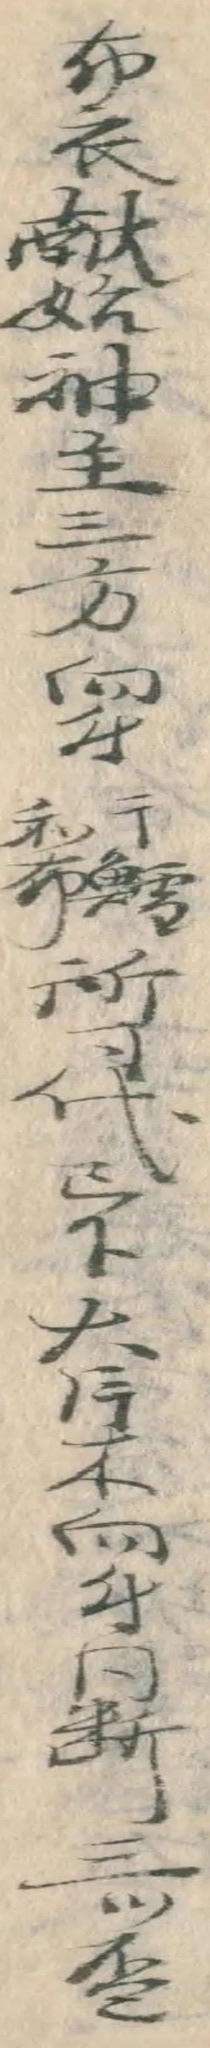布衣献始神主三方向付干鱈和布所司代巳下大片木向付同断三ツ盃
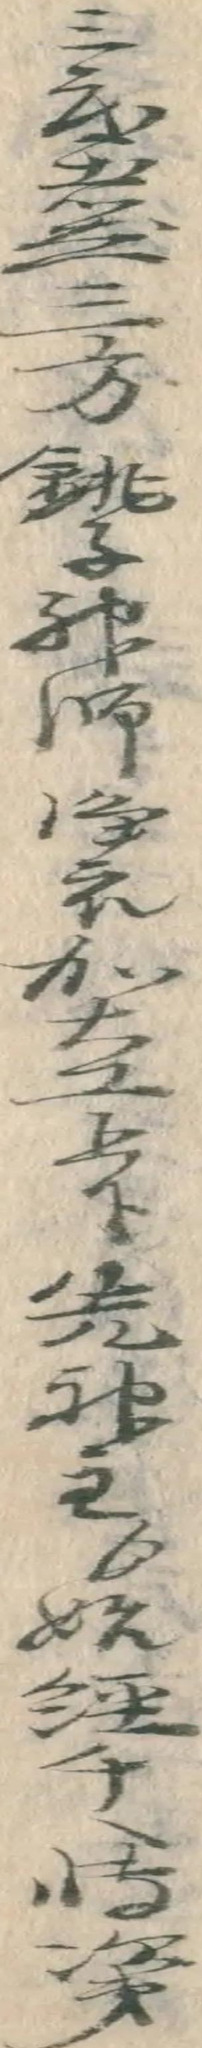三度土器三方銚子神師浄衣加大工上下先神主ゟ始経千へ轉次第
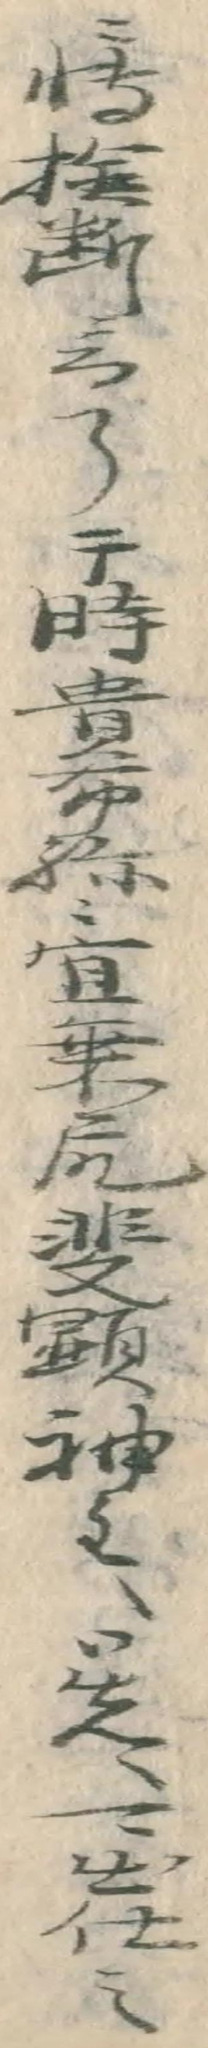ニ轉検断ニ而了于時貴布称々宜乗尻斐顕神主へ御先へ可仕之

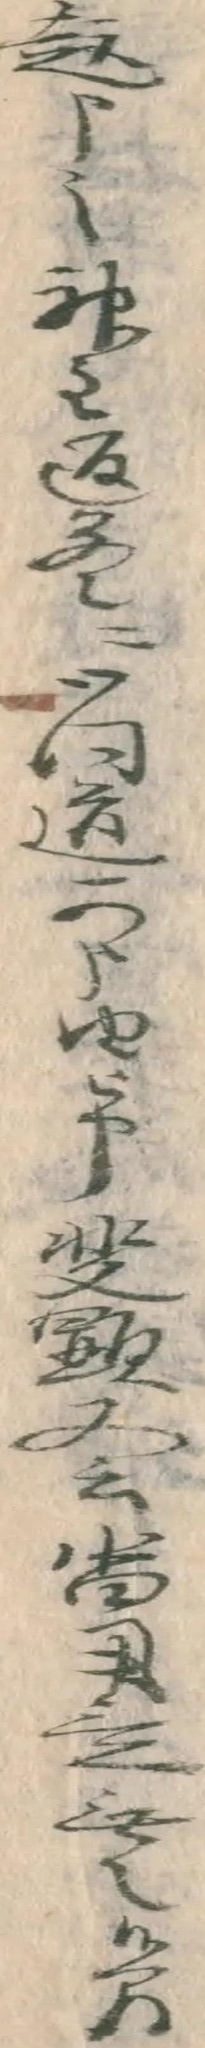趣申之神主返答ニ御同道可申由被申斐顕又云沓用意無之候間
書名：賀茂社記録. 第65冊
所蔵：国立国会図書館 National Diet Library, JAPAN
